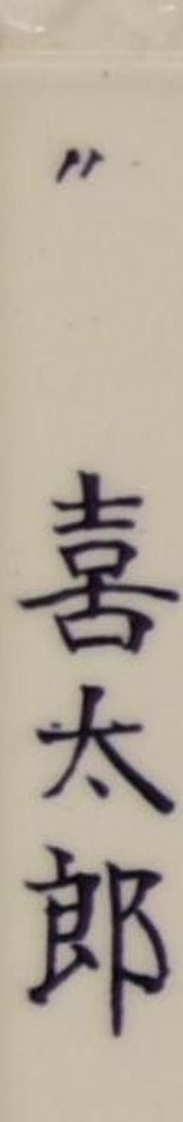喜太郎
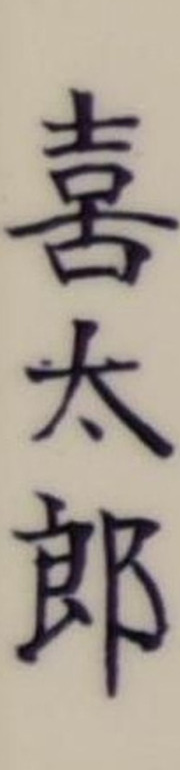喜太郎

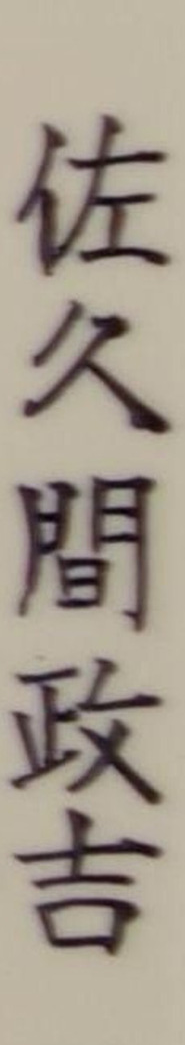佐久間政吉
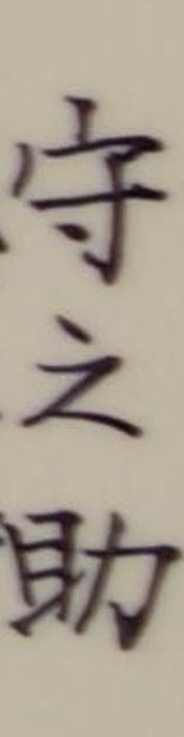守之助
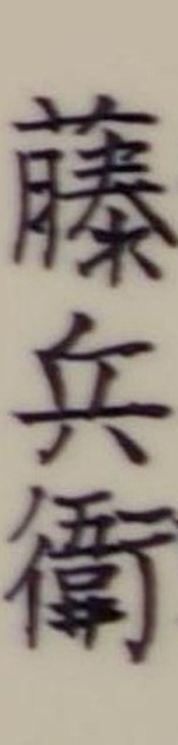藤兵衛
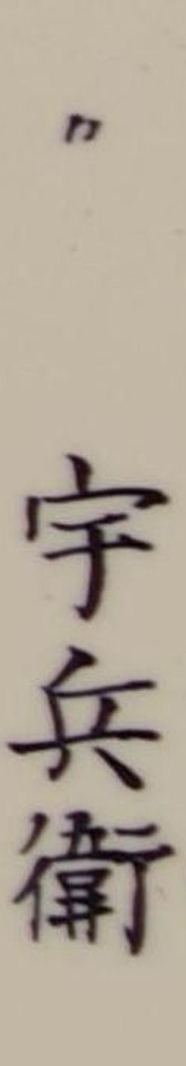宇兵衛
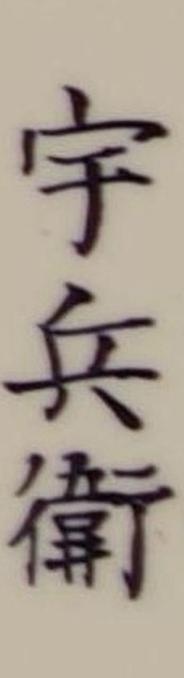宇兵衛
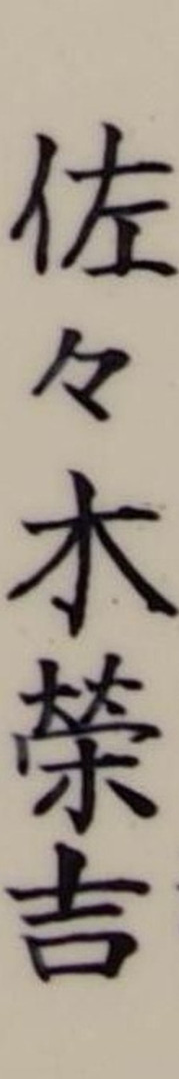佐々木榮吉
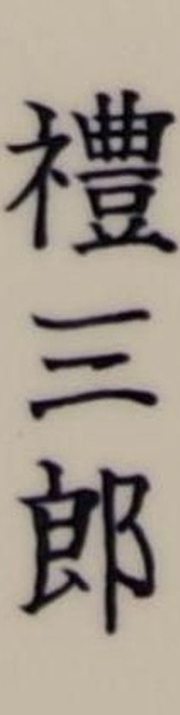禮三郎
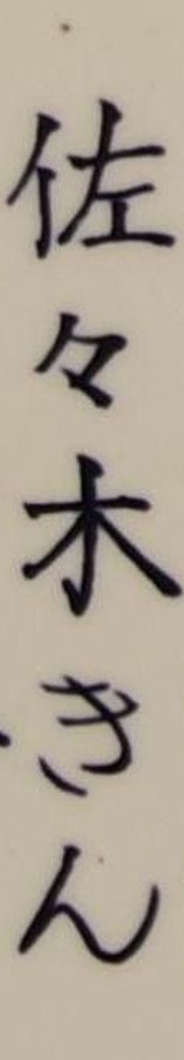佐々木きん
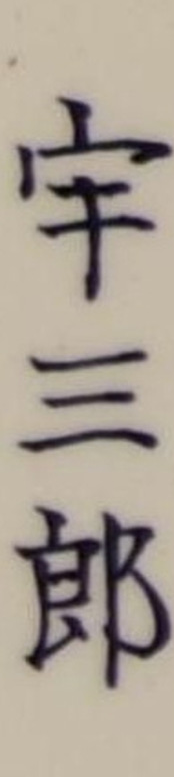宇三郎

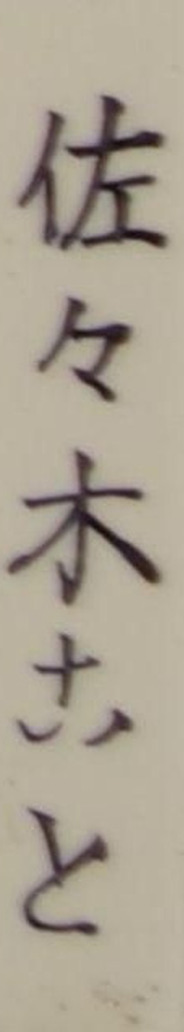佐々木こと
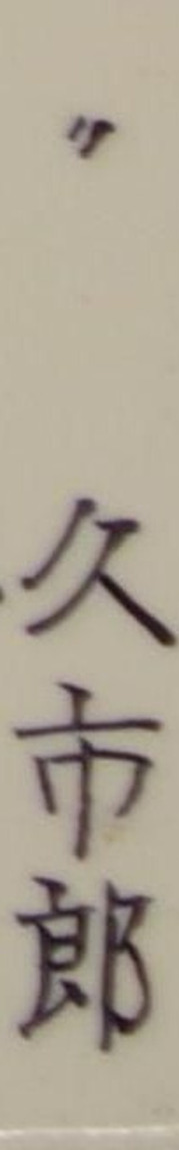久市郎
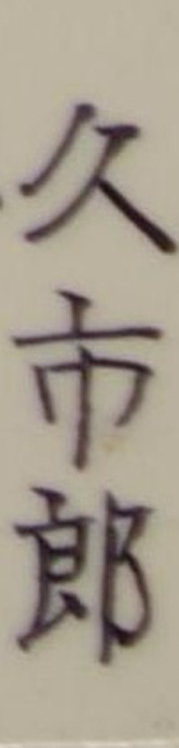久市郎
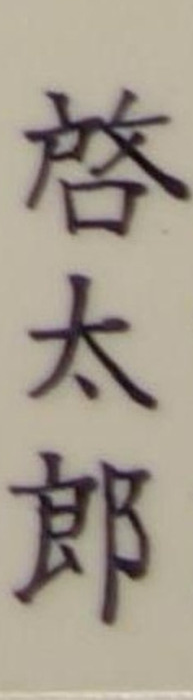啓太郎
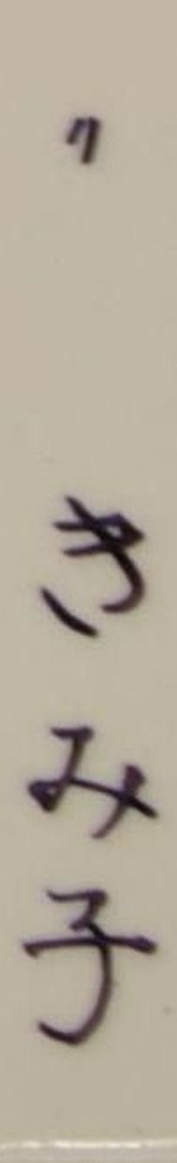きみ子
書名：E~L
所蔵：高野山金剛峯寺
